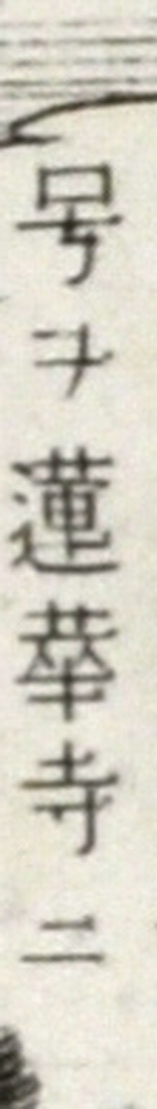号ヲ蓮華寺ニ

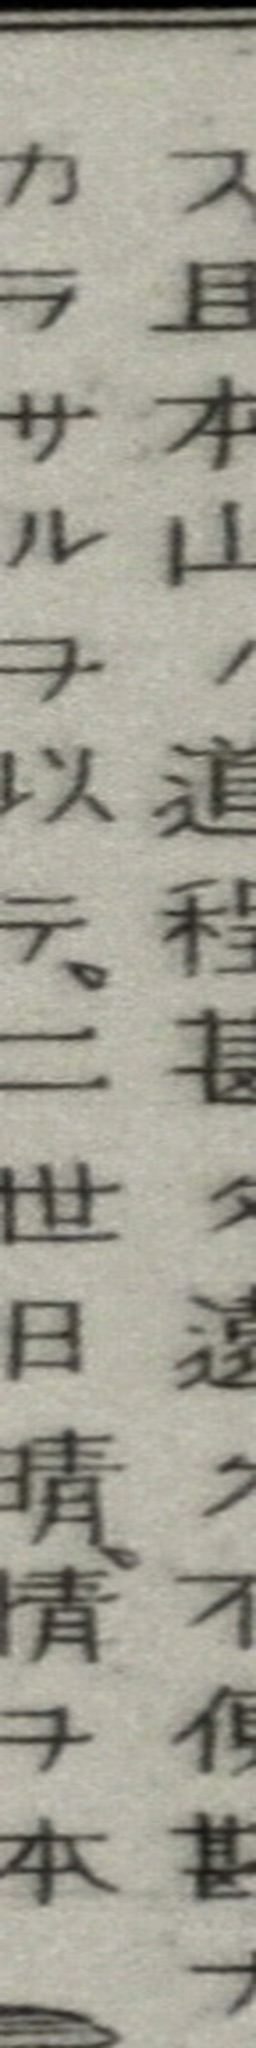ス、且本山ノ道程甚タ遠ク、不便尠ナ
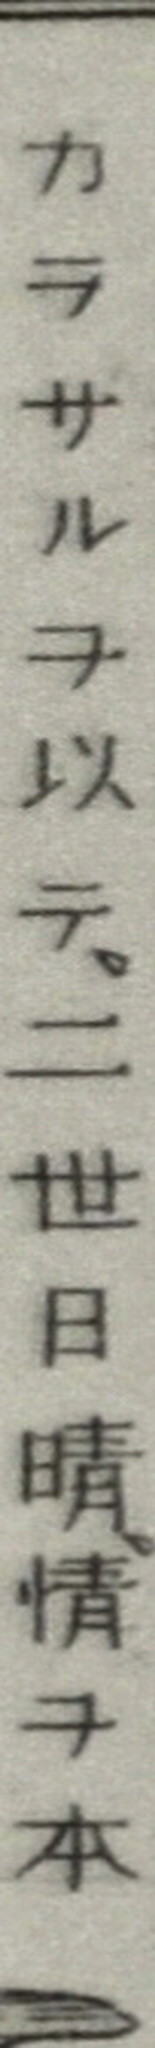カラサルヲ以テ、二世日晴、情ヲ本
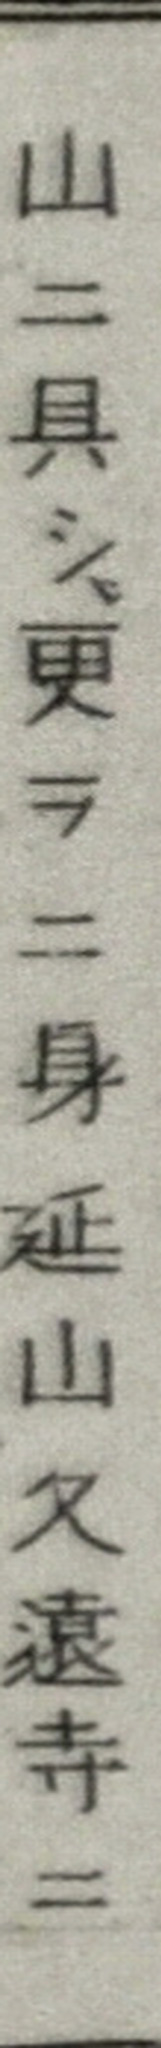山ニ具シ、更ラニ身延山久遠寺ニ
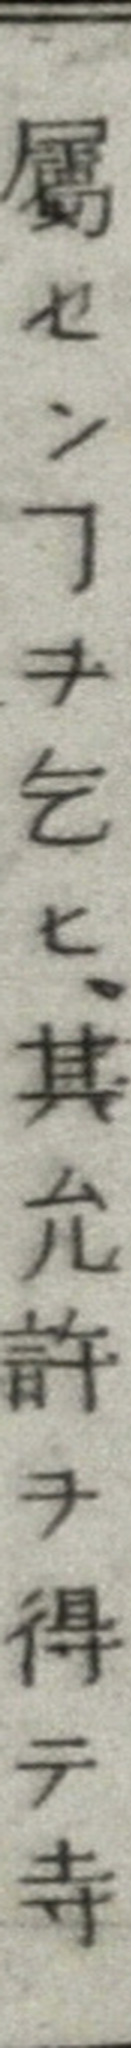属センコトヲ乞ヒ、其允許ヲ得テ寺
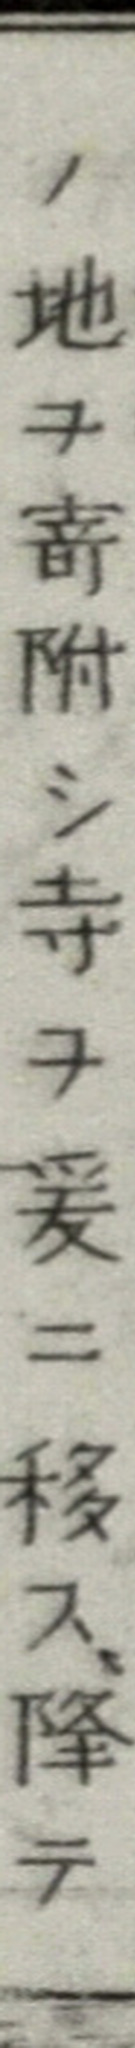ノ地ヲ寄附シ寺ヲ爰ニ移ス、降テ
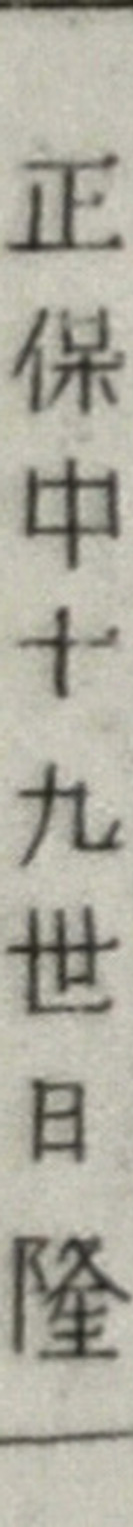正保中十九世日隆
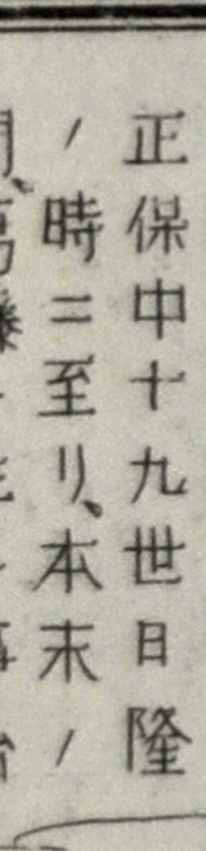正保中十九世日隆
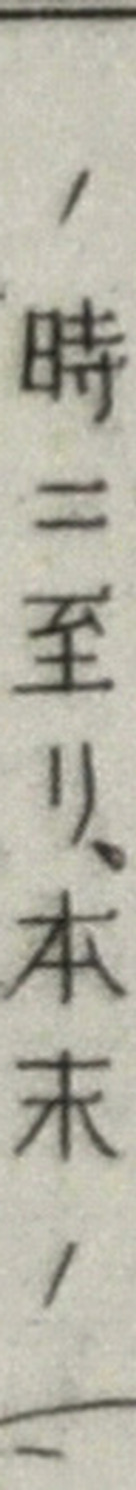ノ時ニ至リ、本末ノ
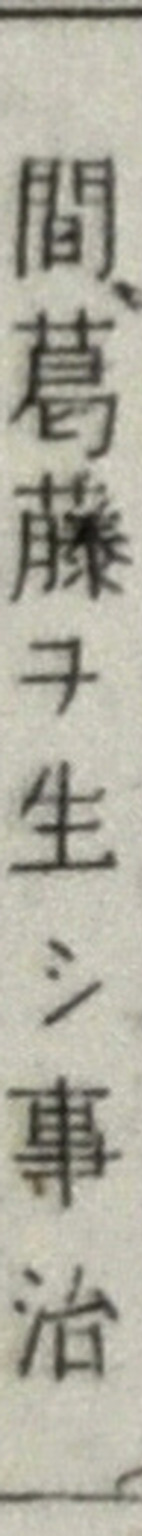間、葛藤ヲ生シ事治
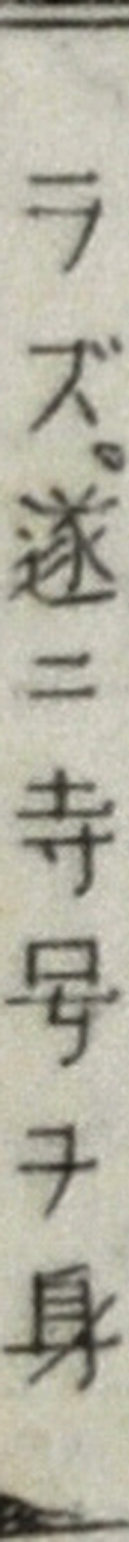ラズ、遂ニ寺号ヲ身
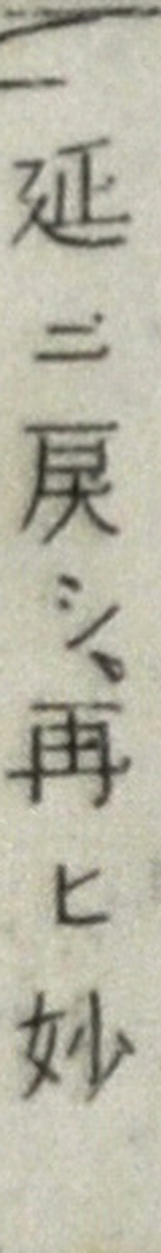延ニ戻シ、再ヒ妙
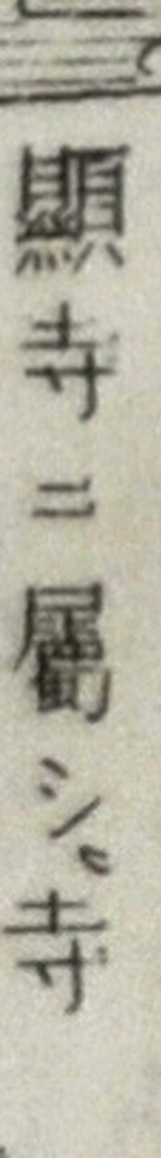顕寺ニ属シ、寺
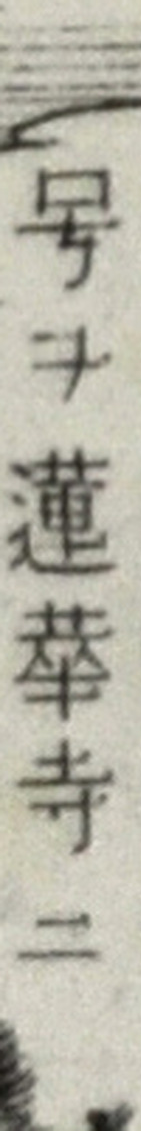号ヲ蓮華寺ニ
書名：桂泉院・樹林寺・東光寺縁起書、蓮華寺由来書、付夕顔観音記
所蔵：伊那市立高遠町図書館・合同会社AMANE
